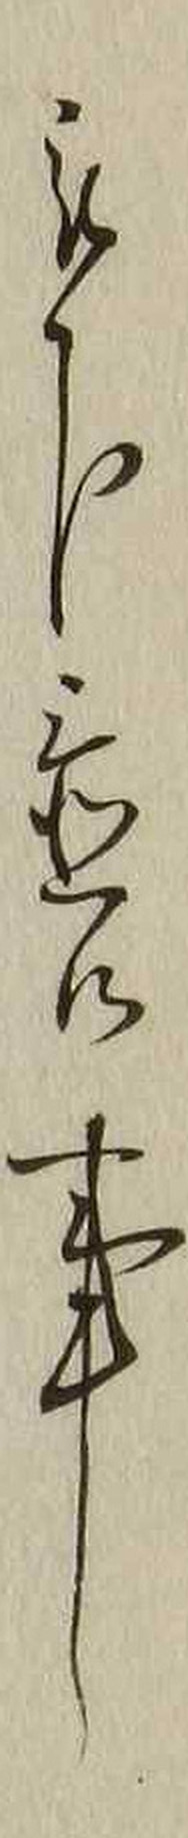被下置候事
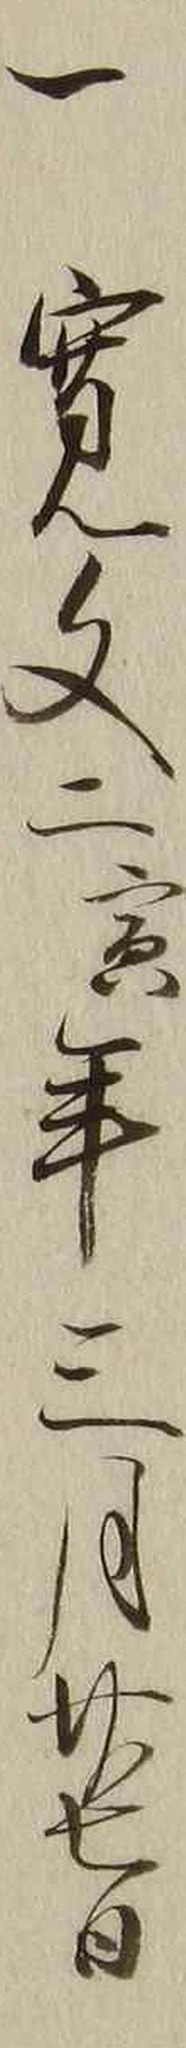一寛文二寅年三月廿七日
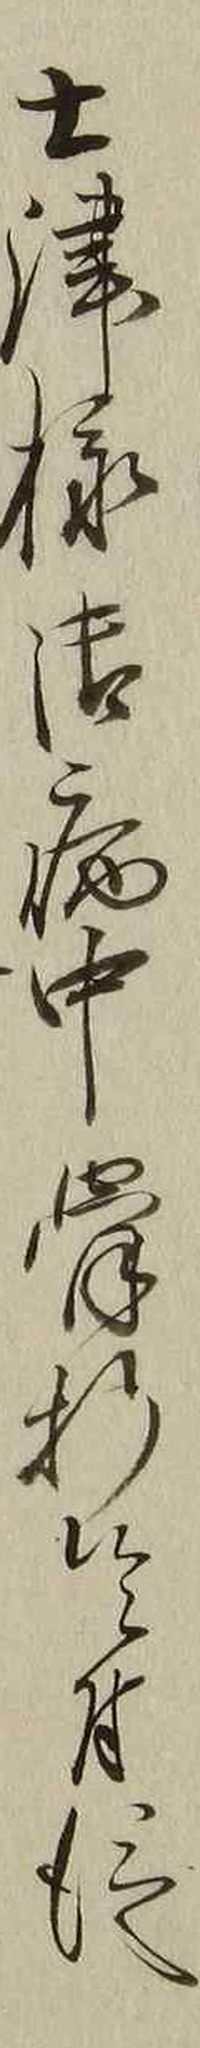土津様御病中骨折候に付従
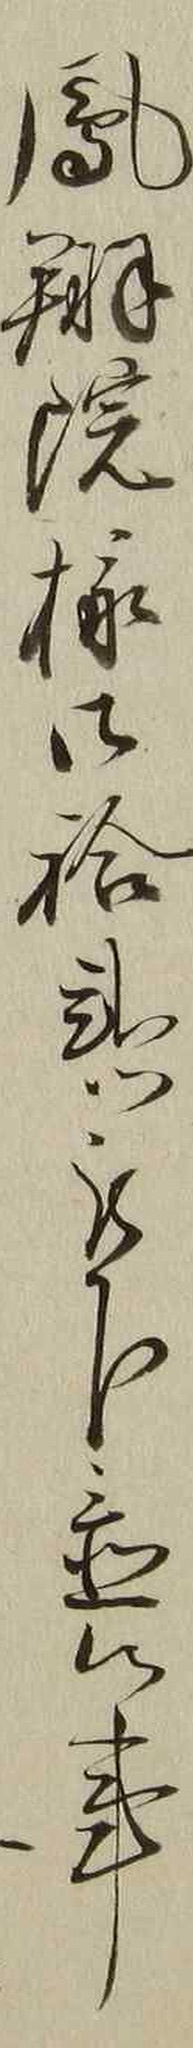鳳翔院様御袷弐つ被下置候事
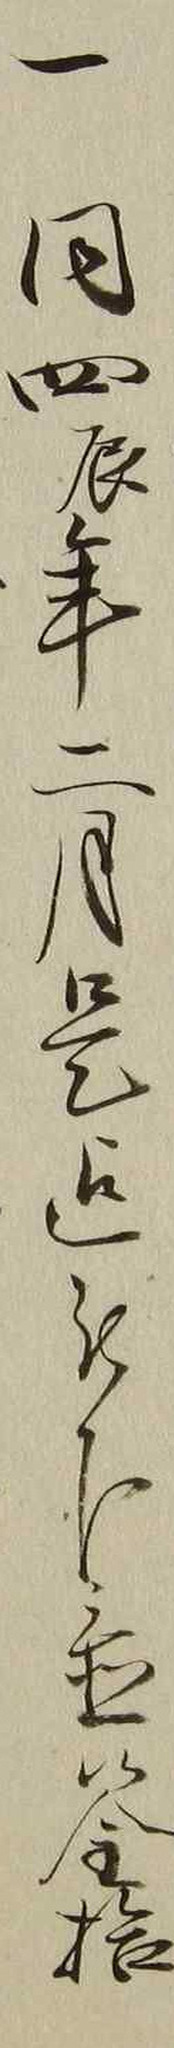一同四辰年二月是迄被下置候金拾
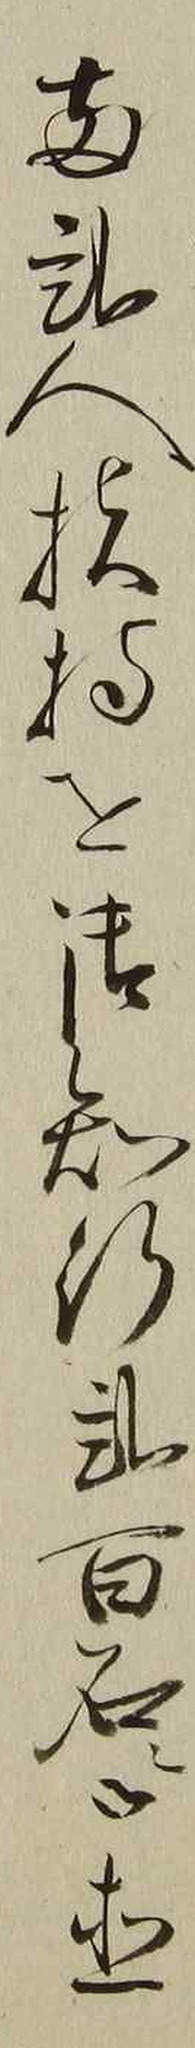両弐人扶持を御知行弐百石に御直
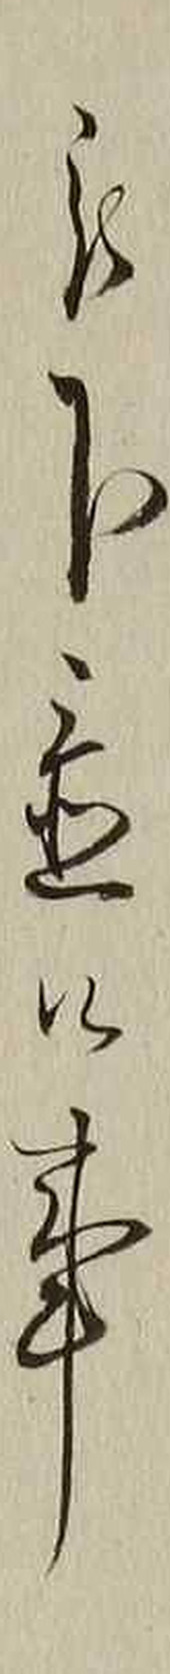被下置候事
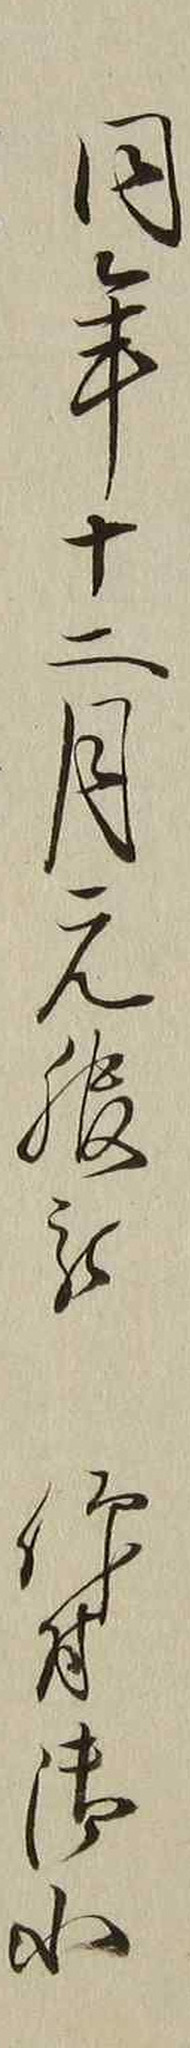一同年十二月元服被仰付御小
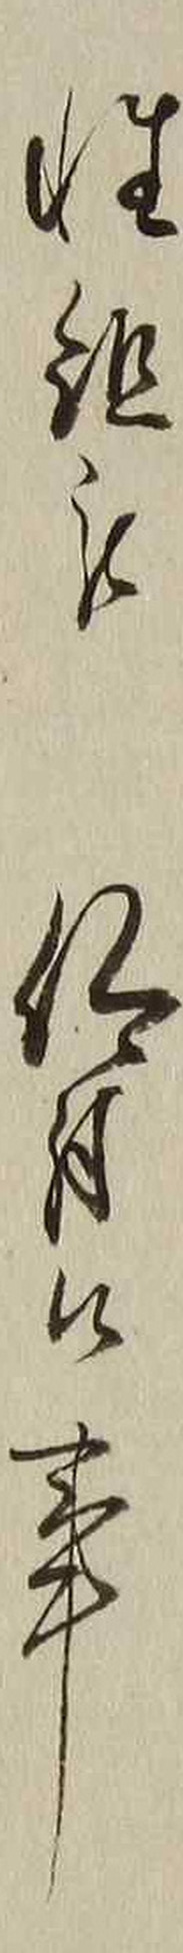性組被仰付候事
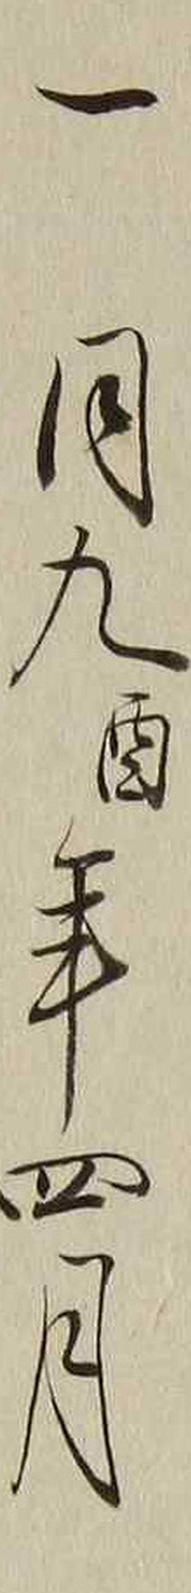一同九酉年四月
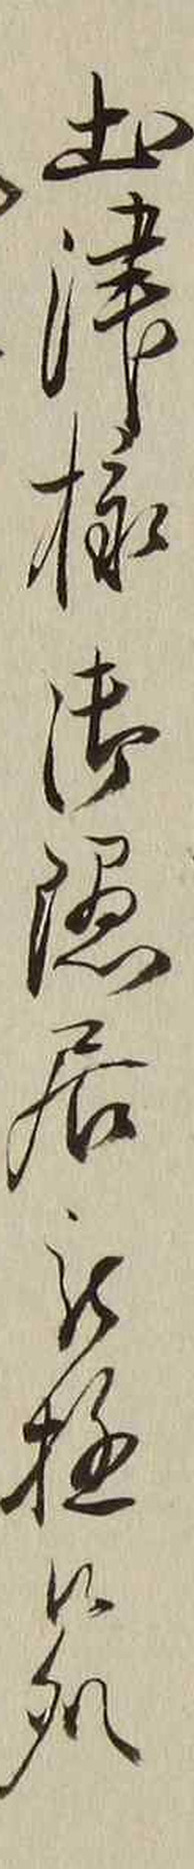土津様御隠居被遊候処
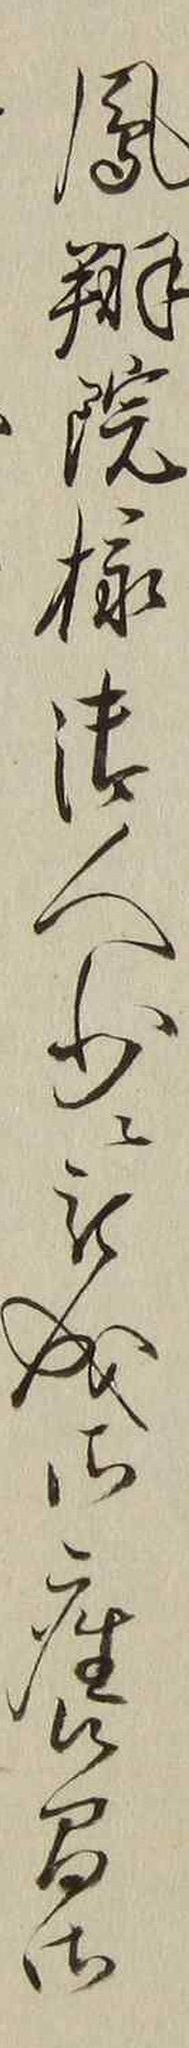鳳翔院様御人少に被成御座候間御
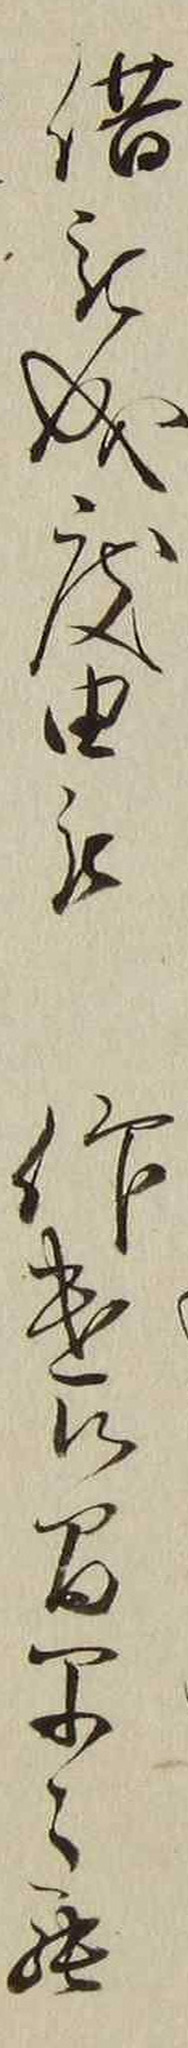借被成度由被仰遣候間早々罷
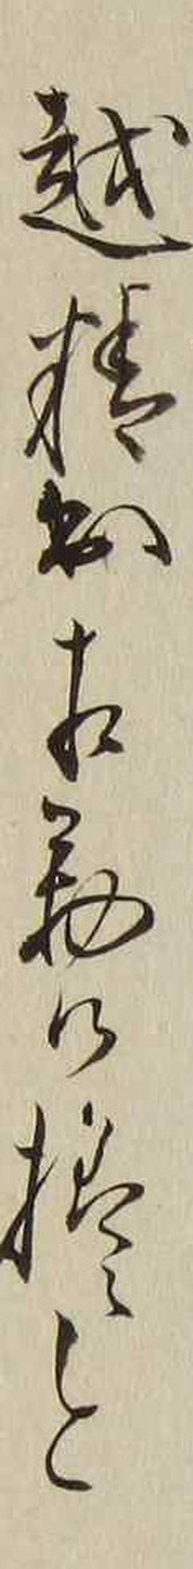越精出相勤候様にと
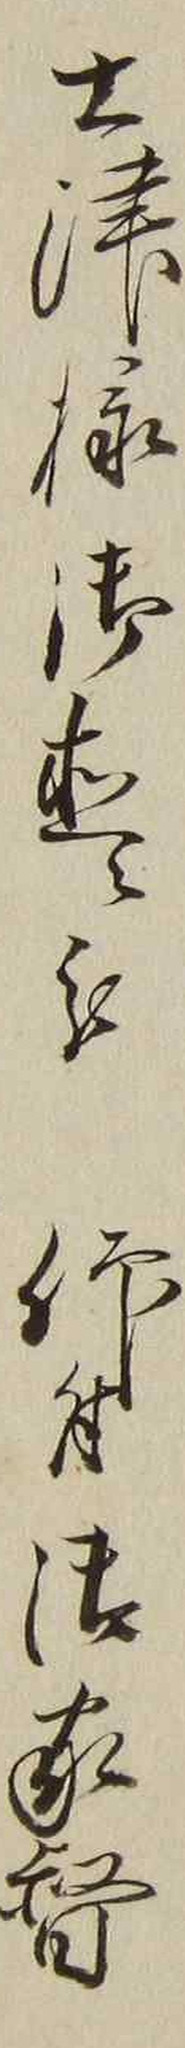土津様御直に被仰付御家督
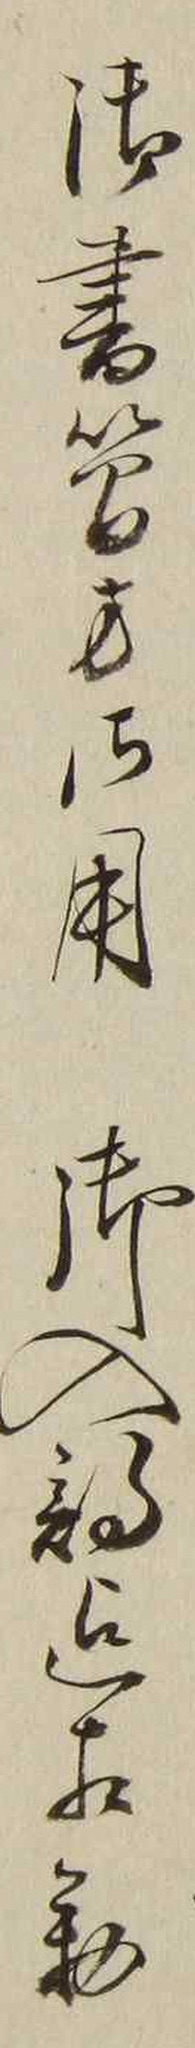御書簡方御用御入部迄相勤
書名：諸士系譜　巻之103　か之部11
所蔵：会津若松市立会津図書館
